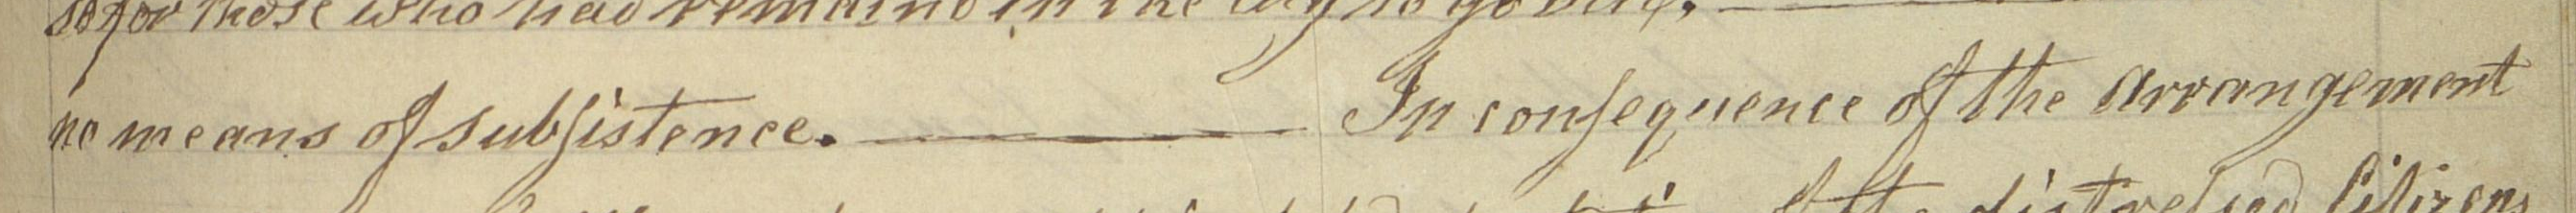no means of subsistence. In consequence of the arrangement
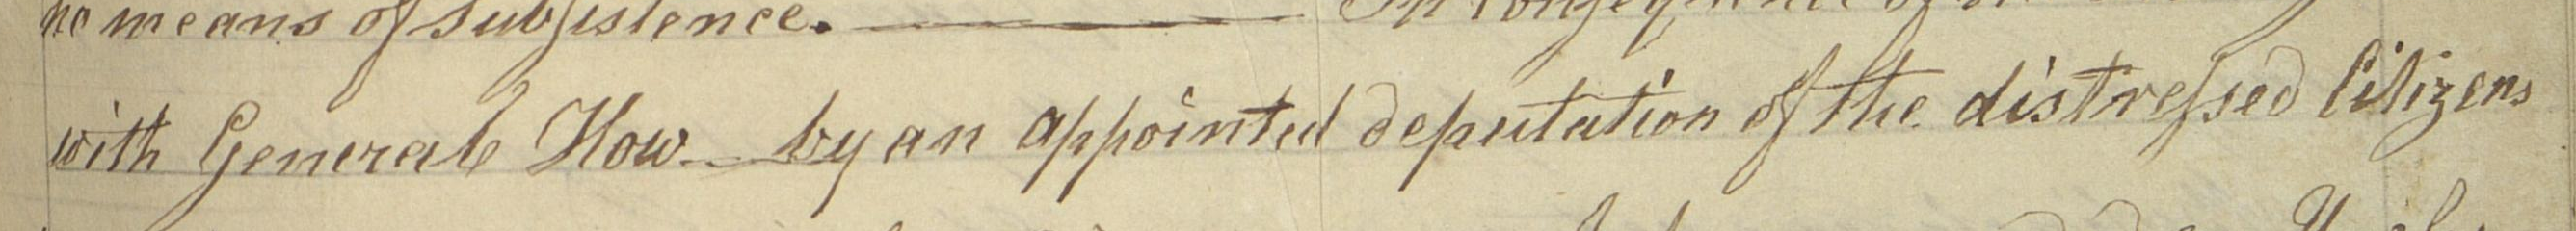with General How, by an appointed deputation of the distressed Citizens
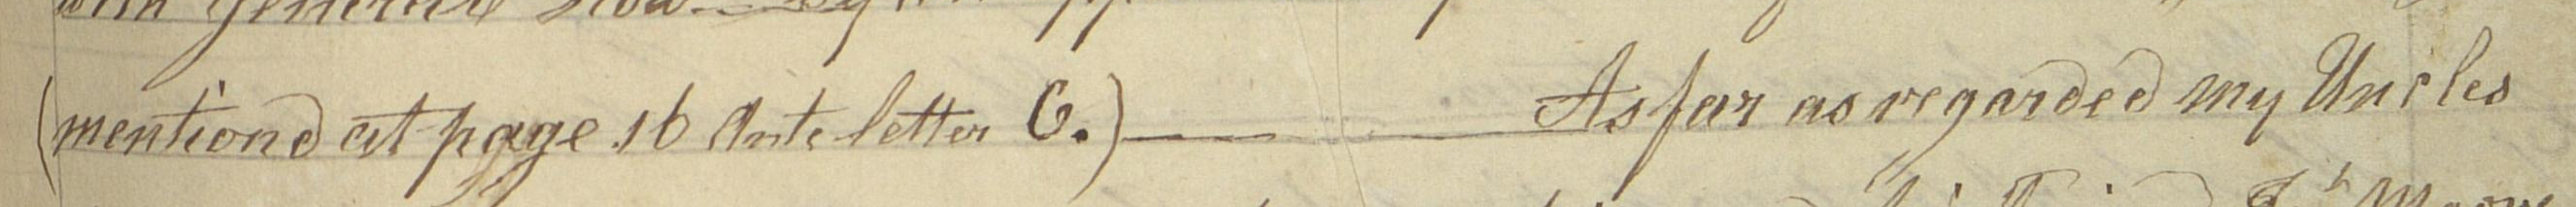(mentiond at page 16 Ante letter C.) As far as regarded my Uncles
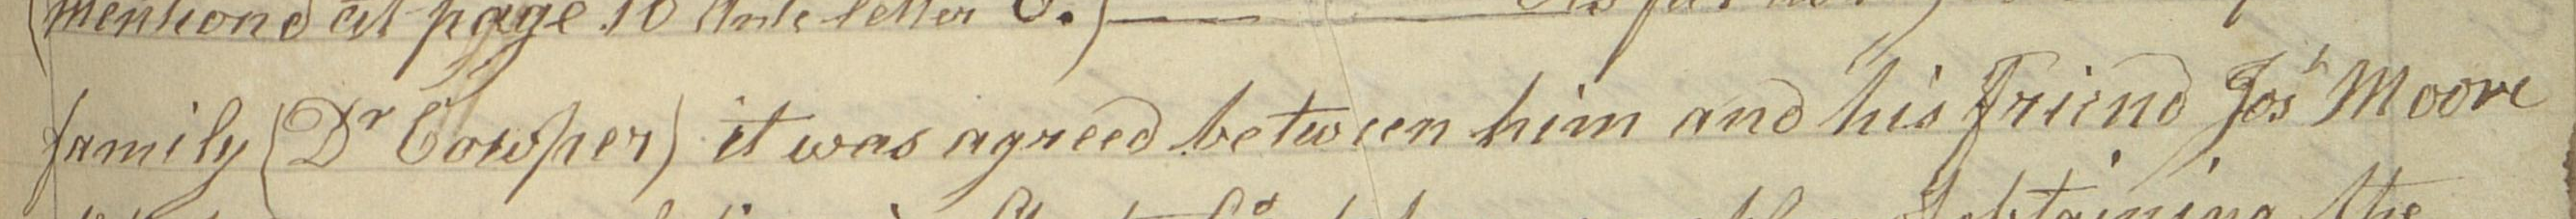family (D^r Cowper) it was agreed between him and his friend Jos^h Moore
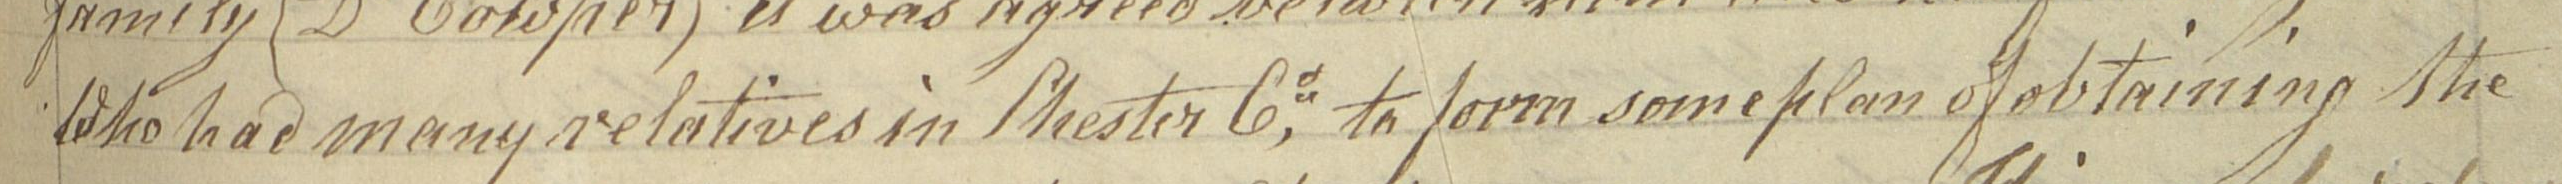who had many relatives in Chester C^o. to form some plan of obtaining the
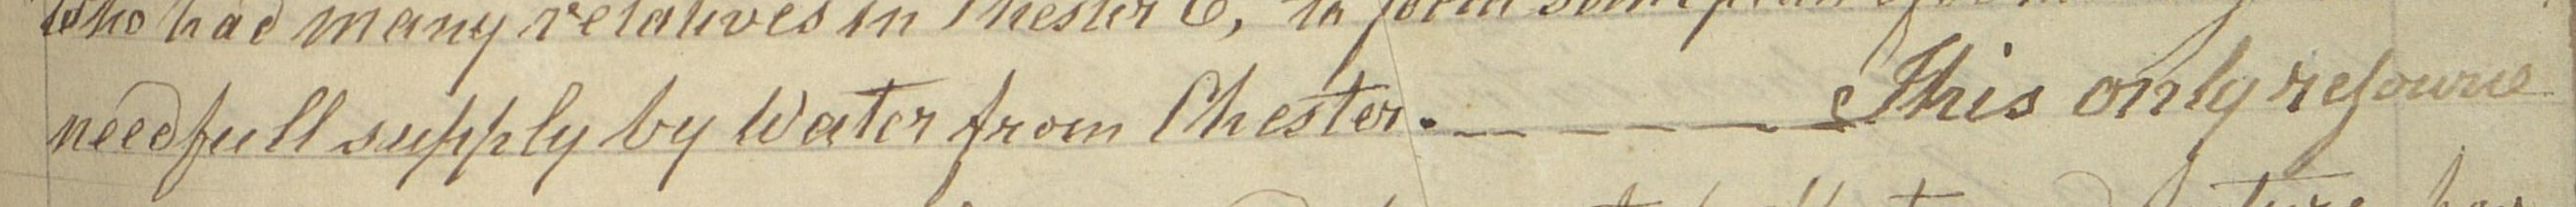needfull supply by Water from Chester. This only resource
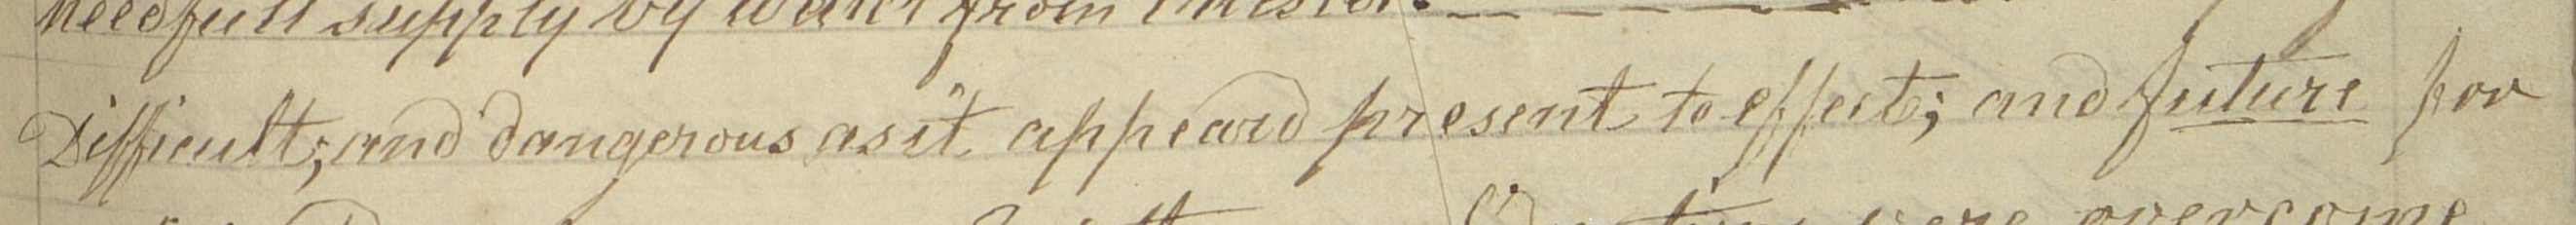difficult, and dangerous as it appeard present to effect; and future for
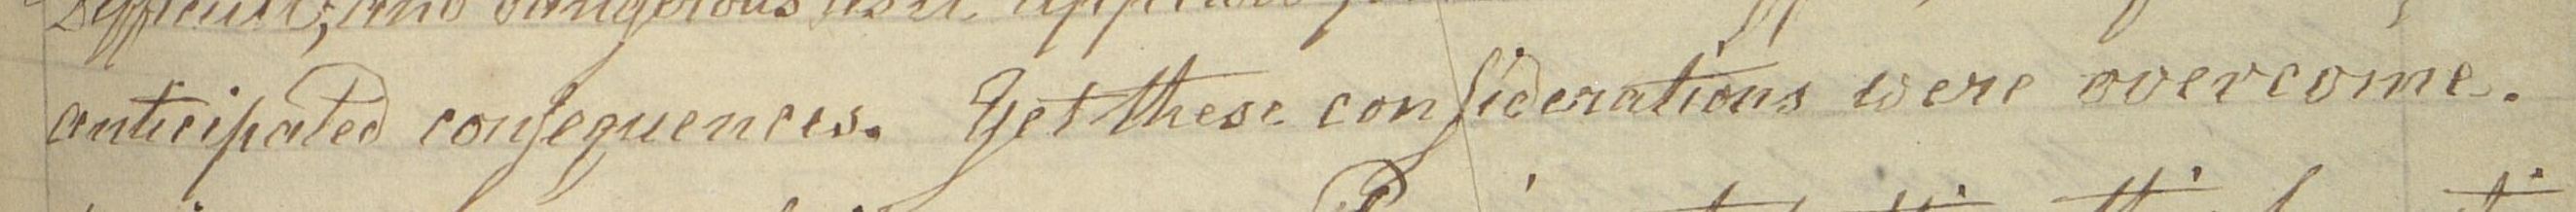anticipated consequences. Yet these considerations were overcome.
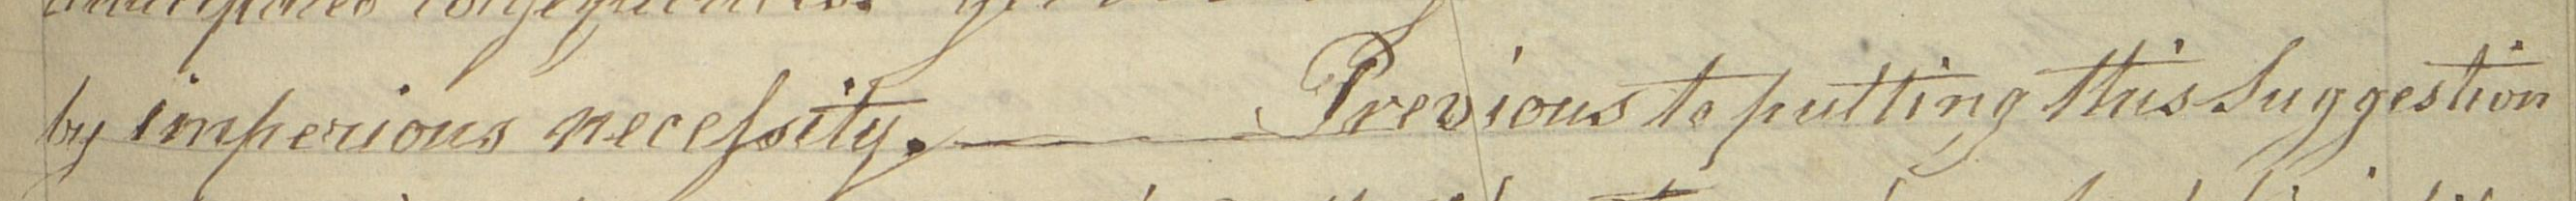by imperious necessity. Previous to putting this Suggestion
